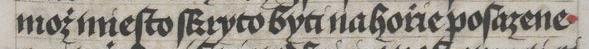moż mieſto ſkryto byti na hoṙie poſazene.
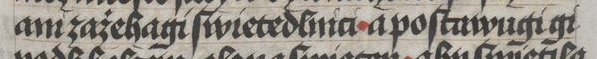Ani zażehagí ſwíetedlnici.a poſtawugí gi
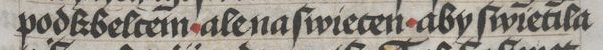podkbelcem.ale na ſwíecen.aby ſwietila
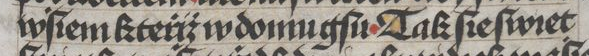wẛiem kteṙíż w domu gſu.Tak ſie ſwiet
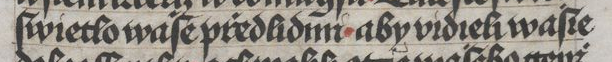ſwietlo waẛe pṙedlidmi.aby vidieli waẛie
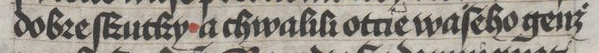dobre ſkutky.achwalili otcie waẛeho genż
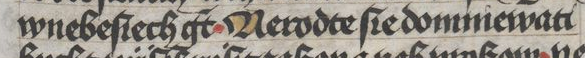wnebeſiech ḡt.Nerodte ſie domniewati
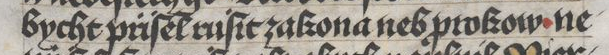bycht pṙiẛel ruẛit zakona neb ꝓrokow.ne¬
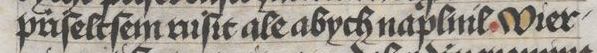pṙiẛelt ſem ruẛit ale abych naplnil.Vier¬
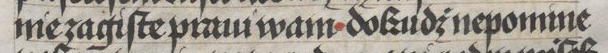nie zagiſtte praui wam.dokudż nepomine
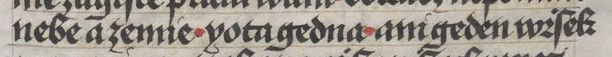nebe a zemie.yota gedna.ani geden wrẛek¬
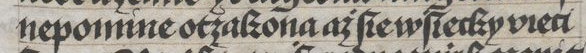nepomine otzakona aż ſie wẛlecky vieci
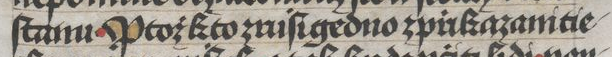ſtanu.Ꝓtoż kto zruẛi gedno zpṙikazani tie¬
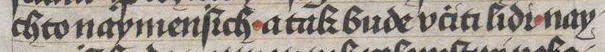chto naymenẛich.a tak bude vċiti lidi.nay¬
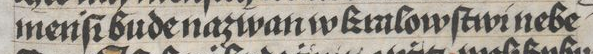menẛi bude nazwan w kralowſtwí nebe¬
